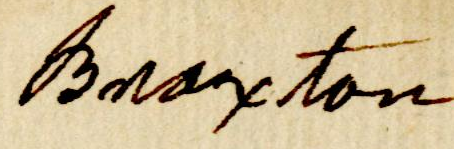Braxton
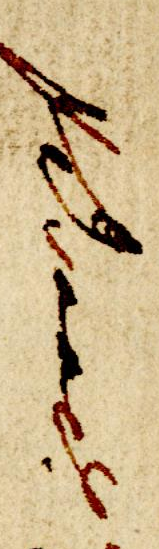per James
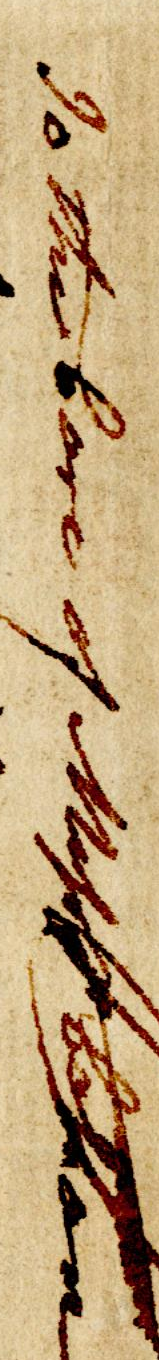to the care of Maj^r Grason
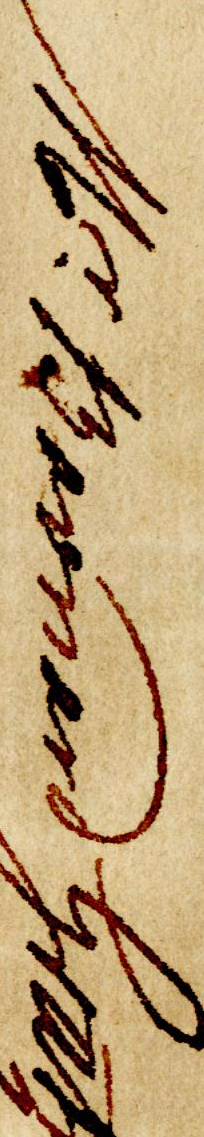M^r Barnard Gratz
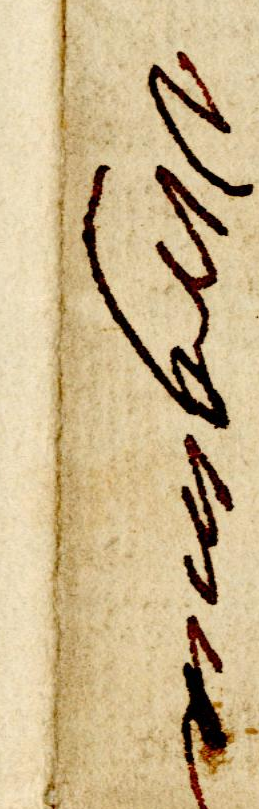Virginia
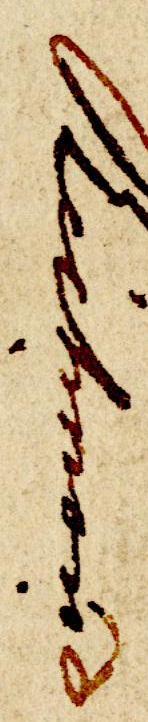Richmond
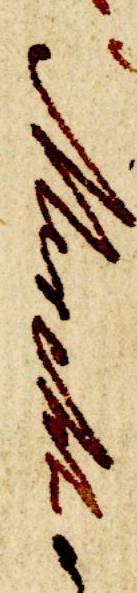Merch^t
